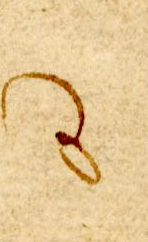@
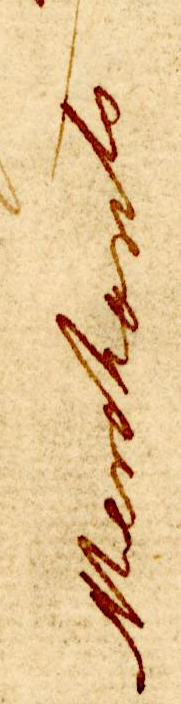Merchant
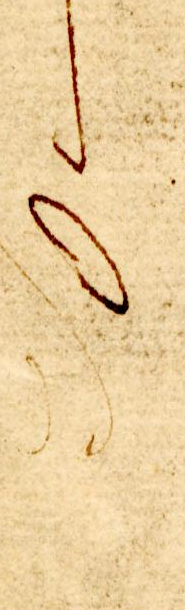To-
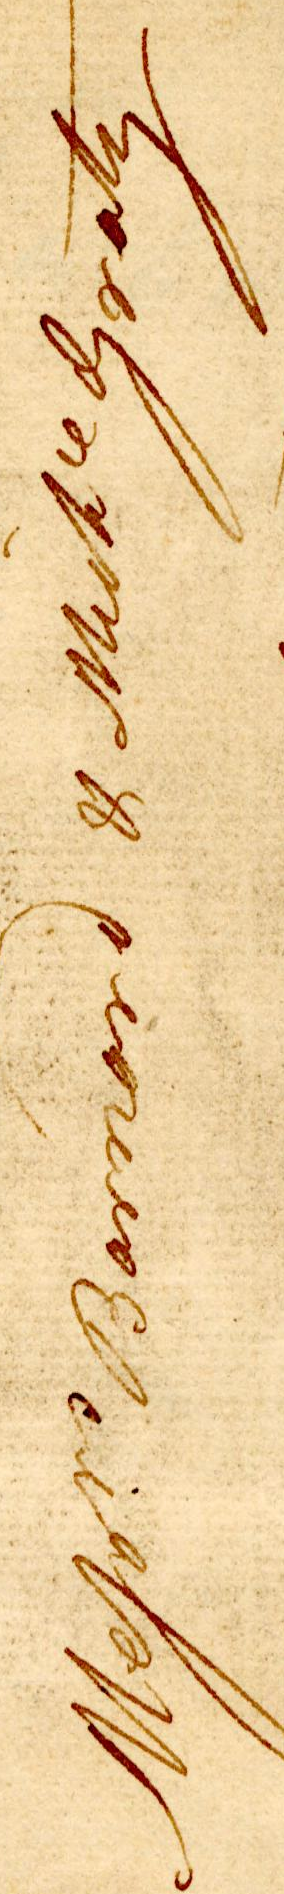Mess^rs. Barnard & Mich^l. Gratz
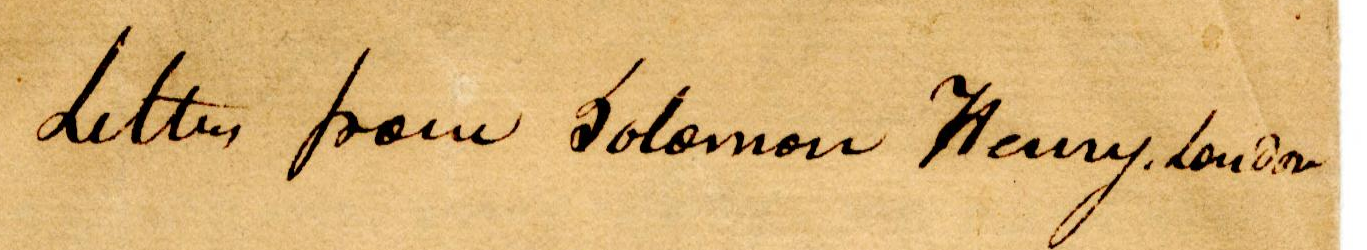Letter From Solomon Henry, London
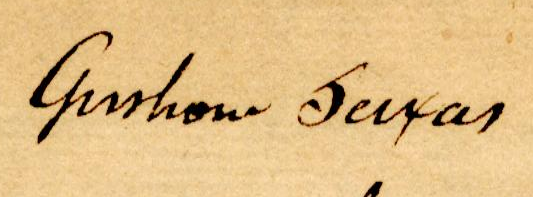Greshom Seixas
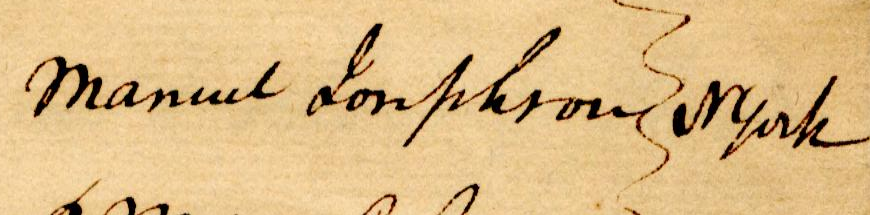Manuel Lonphron NYork
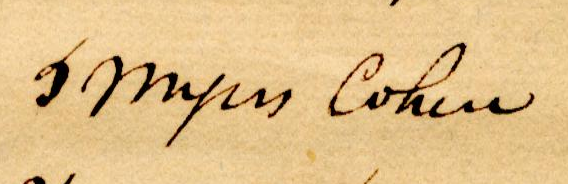S Myers Cohen
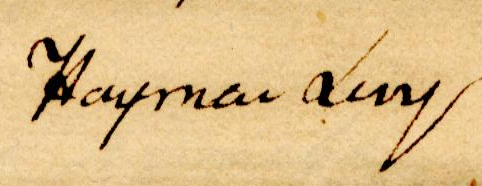Hayman Levy
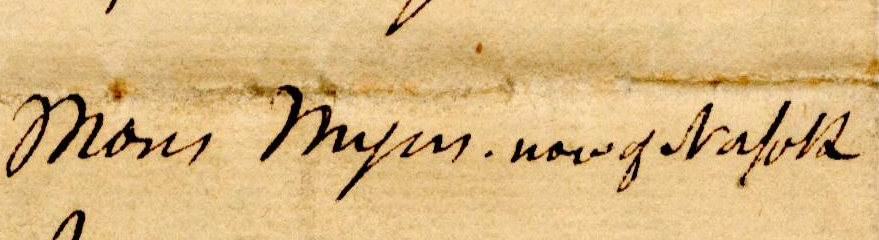Moses Myers now of Norfolk
